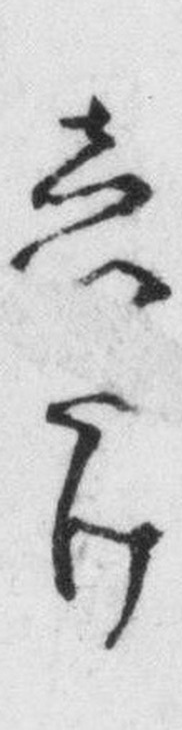志いたけ
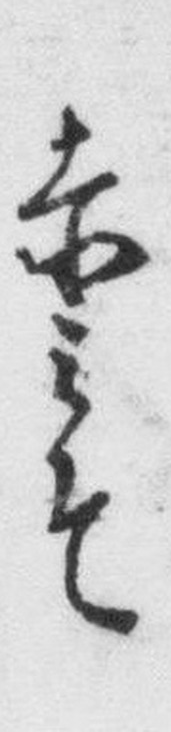赤みそ
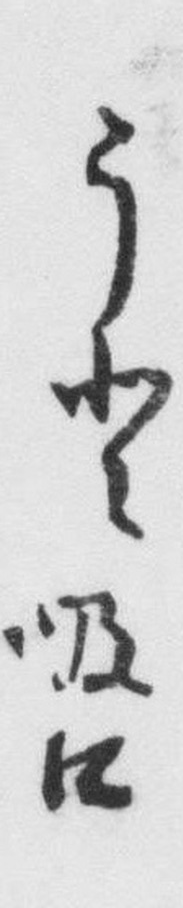う登吸口

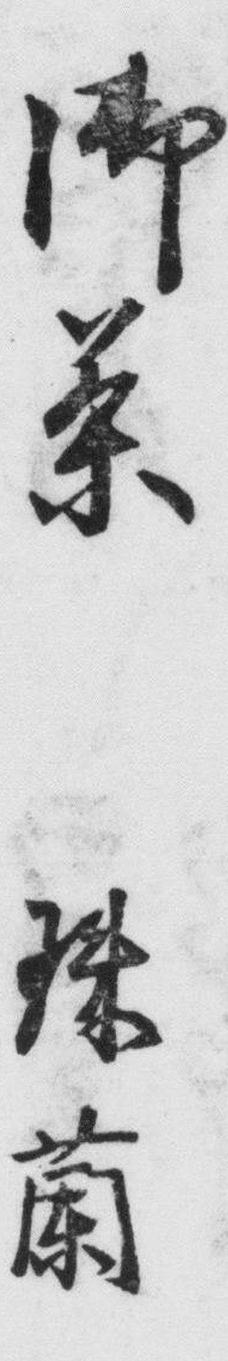御茶珠蘭
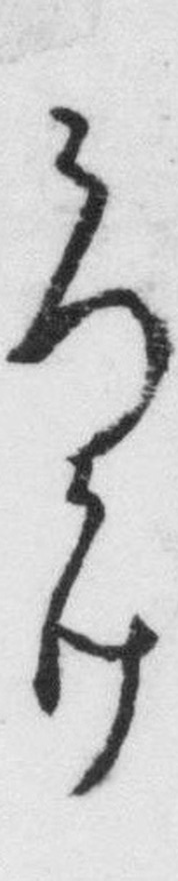みつかけ
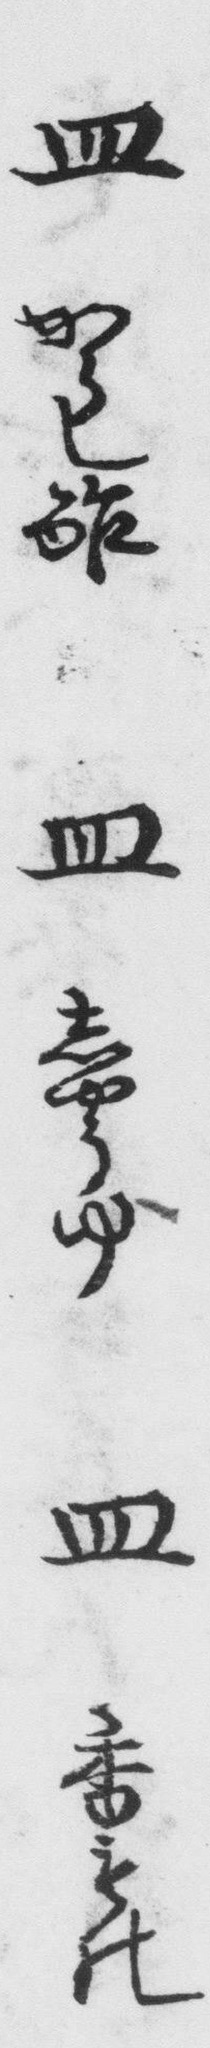皿からし酢皿志やうゆ皿香も能

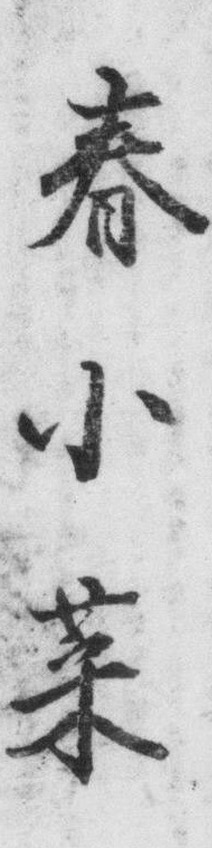春小菜
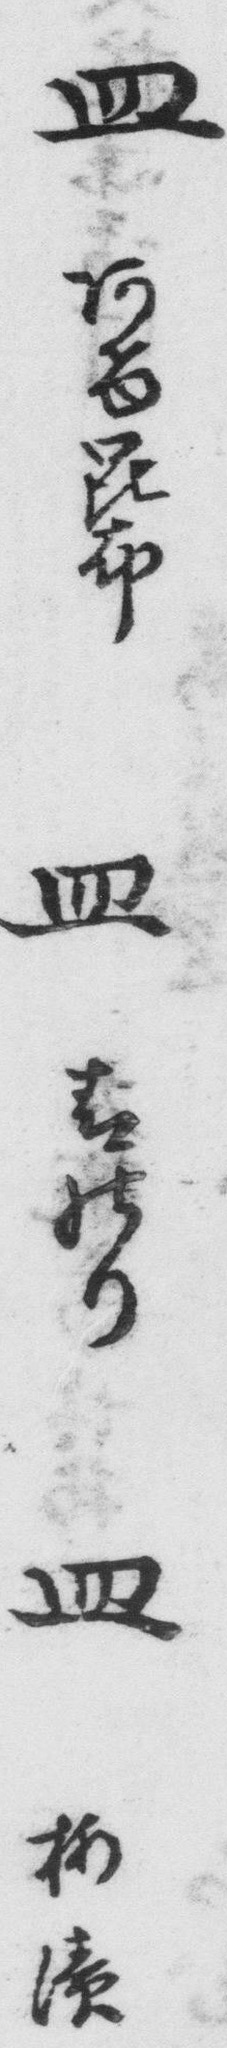皿阿ま昆布皿青能り皿梅漬
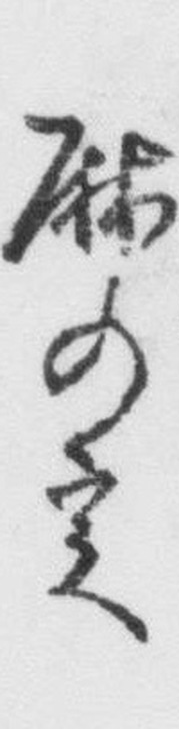麻の実

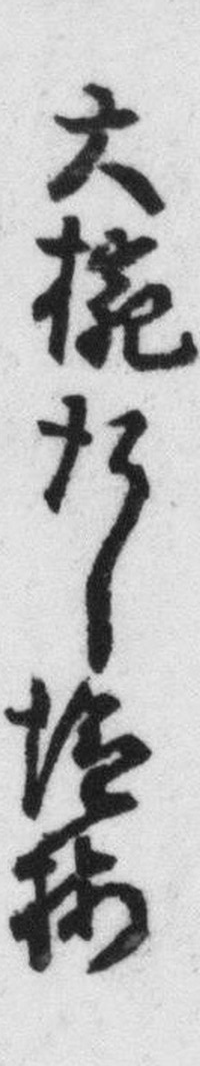大椀さゆ塩梅
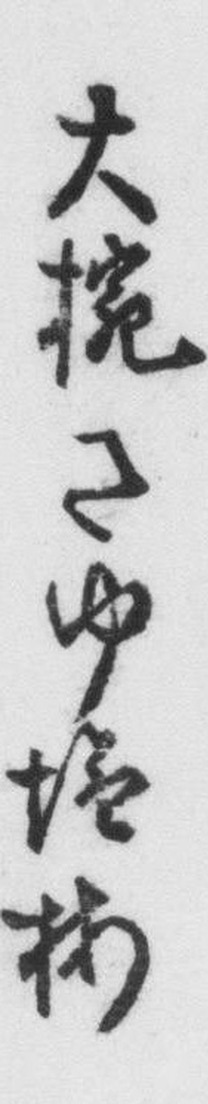大椀さゆ塩梅
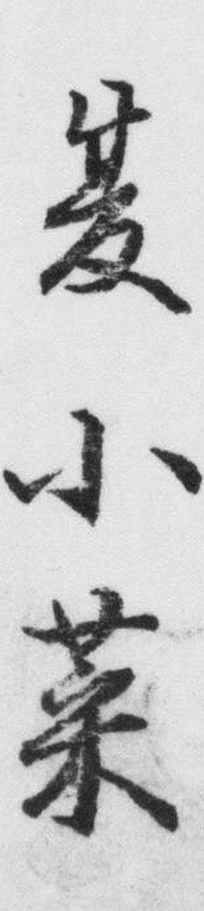夏小菜

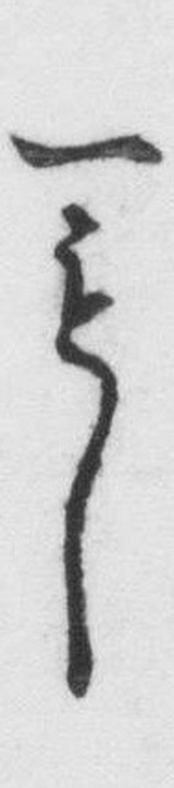一もし
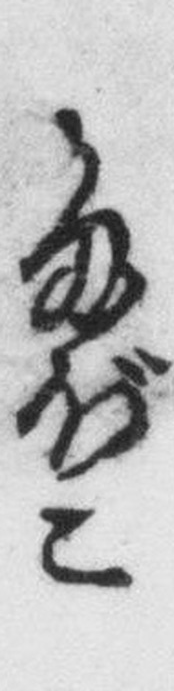かまぼこ
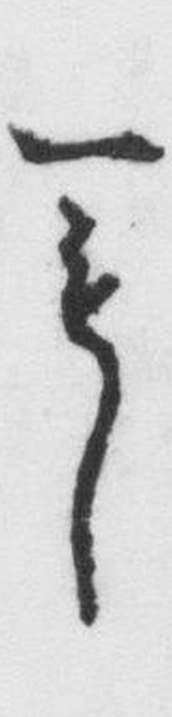一もし
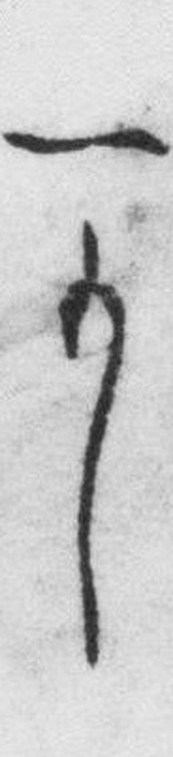一もし
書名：普茶料理抄
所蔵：大阪府立大学学術情報センター 国文学研究資料館
